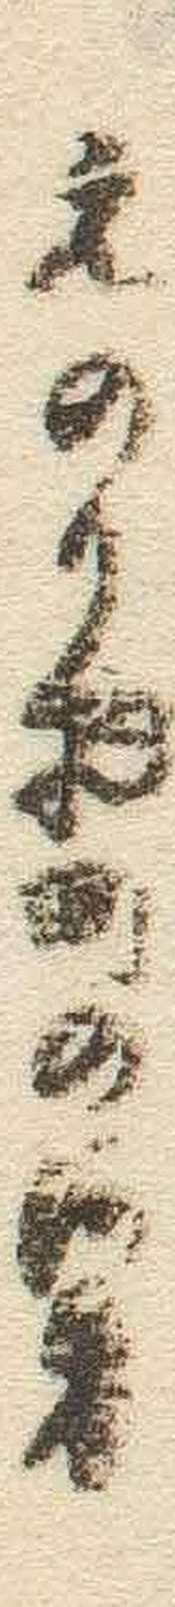元のり物町の河岸
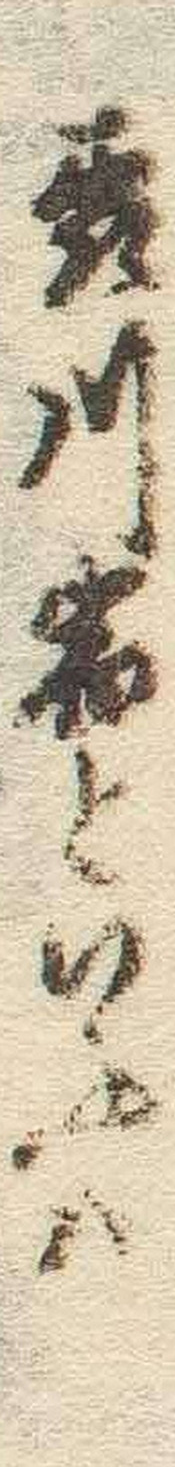森川宿といふは
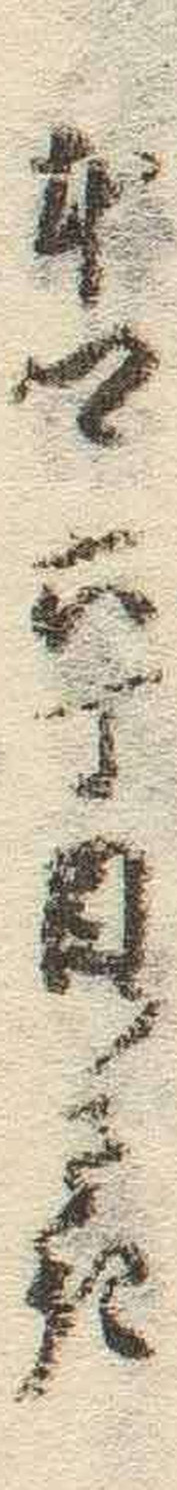本郷六丁目ノさき

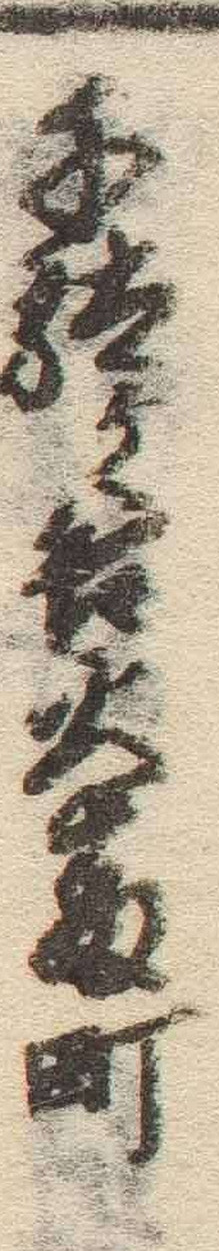千駄ヶ谷火番町
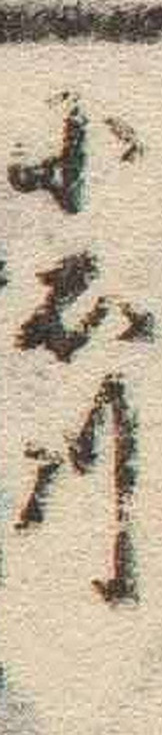小石川
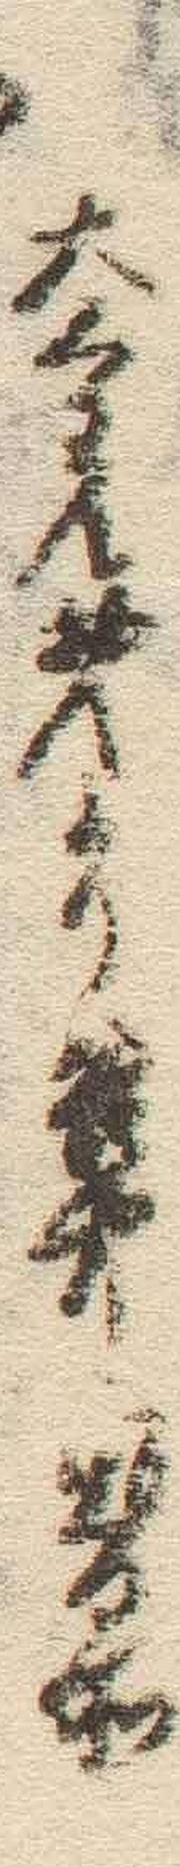大くわんおんより谷中へ出る所
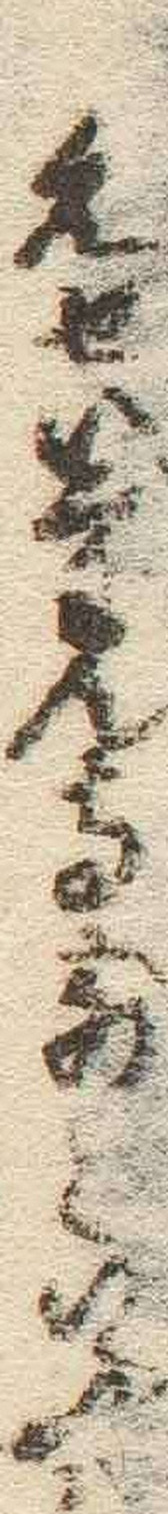元せいぐわん寺前といふは
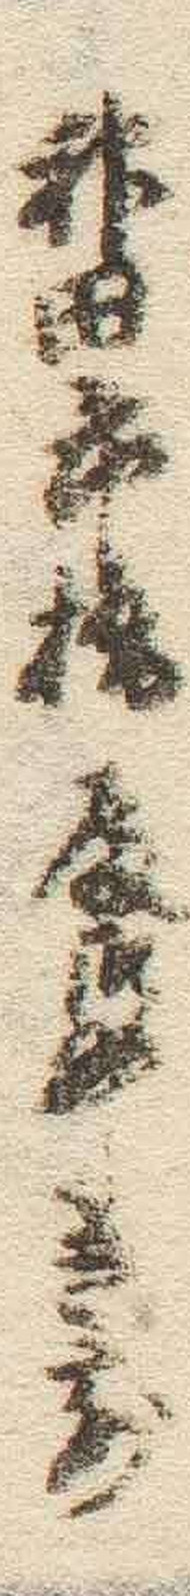神田市橋殿御やしき前
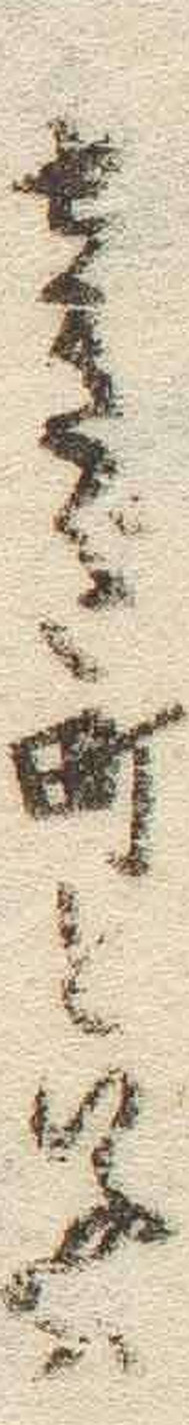せきだ町といふは
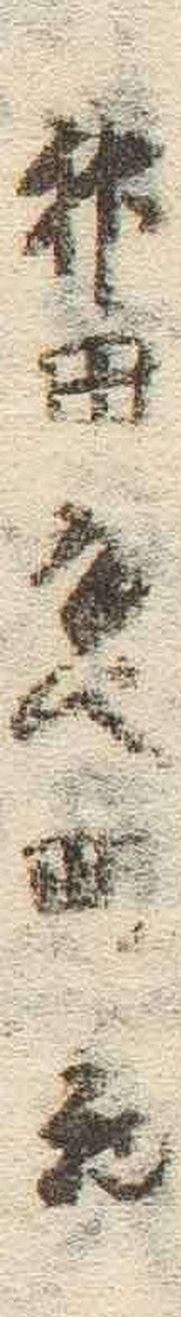神田なべ町ノ西
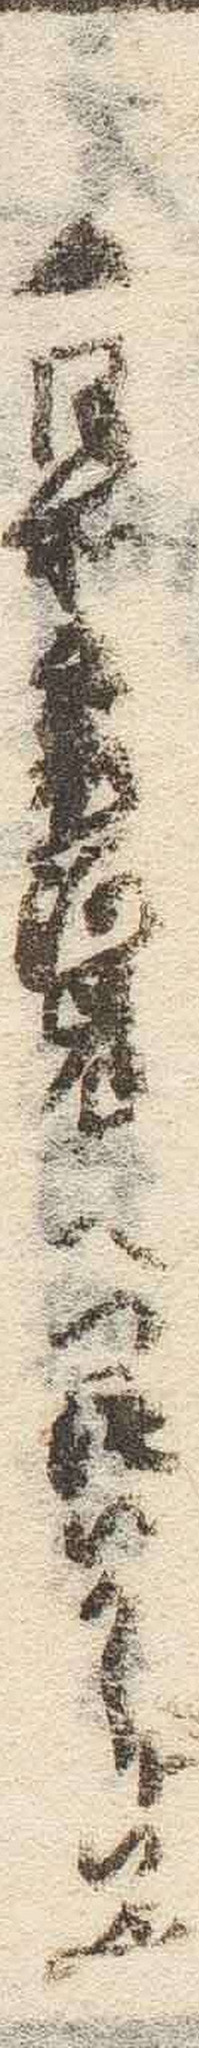▲同所裏河岸へつついかしトいふ
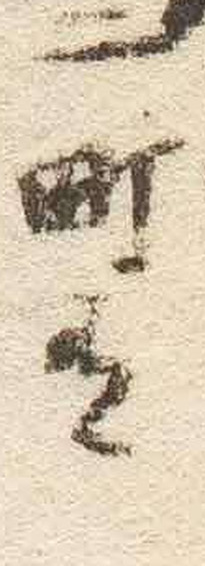二町有
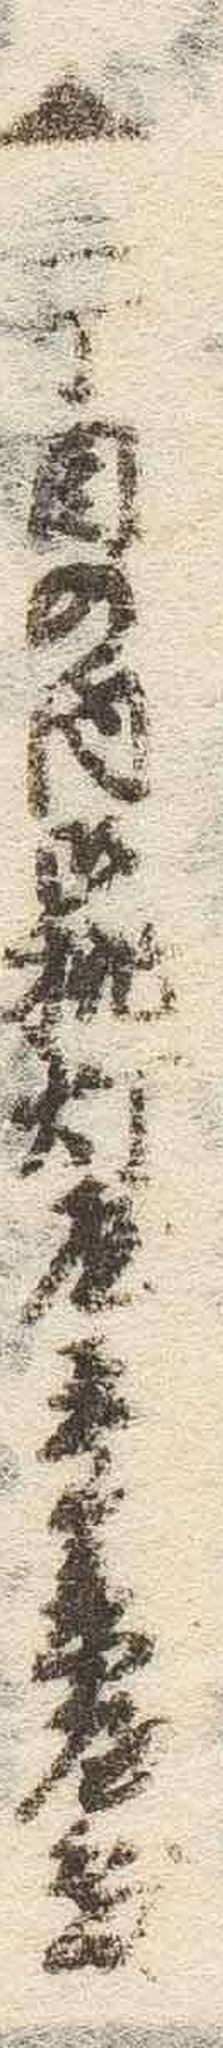▲二丁目の内御挑灯屋平兵衛屋敷
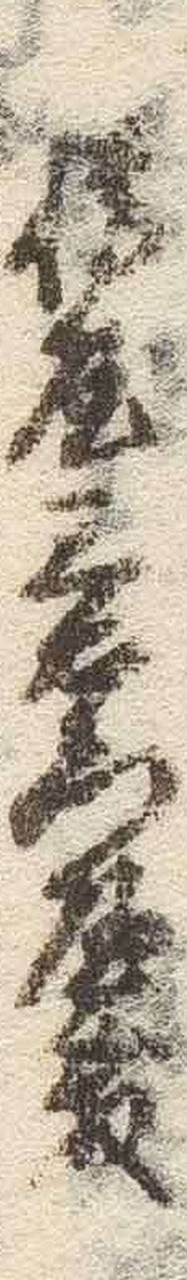樽屋三右衛門屋敷
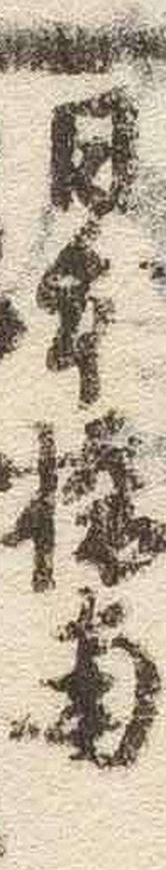日本橋南
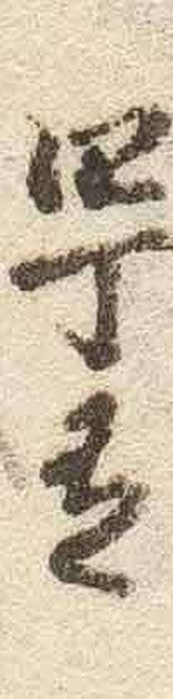四丁有
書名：江戸町独案内
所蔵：東京学芸大学附属図書館 国文学研究資料館
